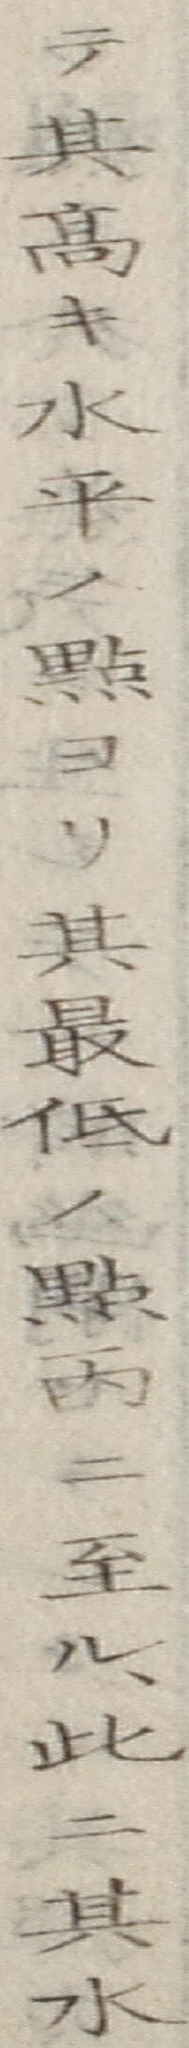テ其高キ水平ノ点ヨリ其最低ノ点丙ニ至ル、此ニ其水
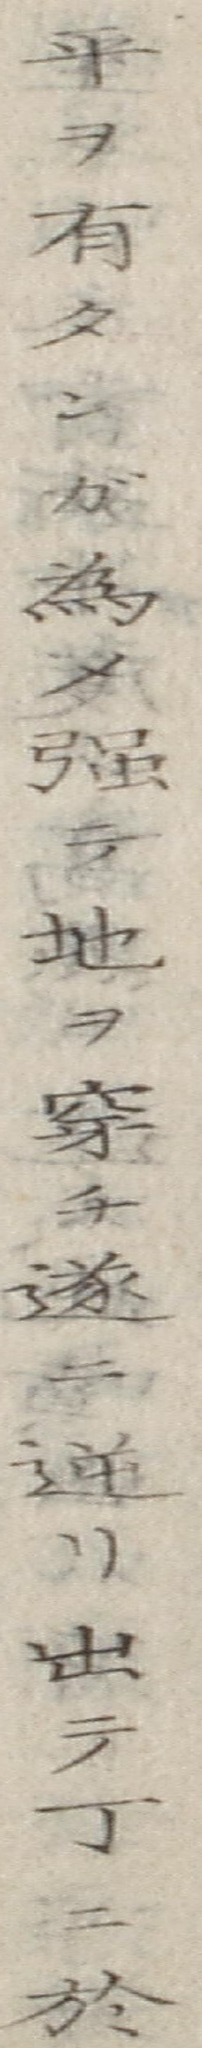平ヲ有タンガ為メ強テ地ヲ穿チ遂ニ逆リ出テ丁ニ於
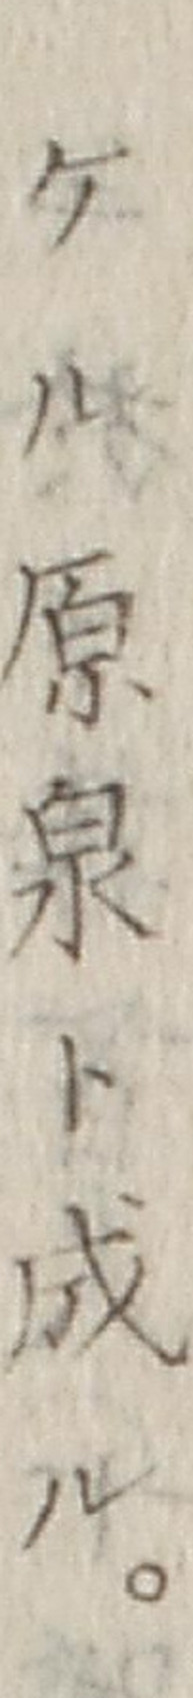ケル原泉ト成ル。
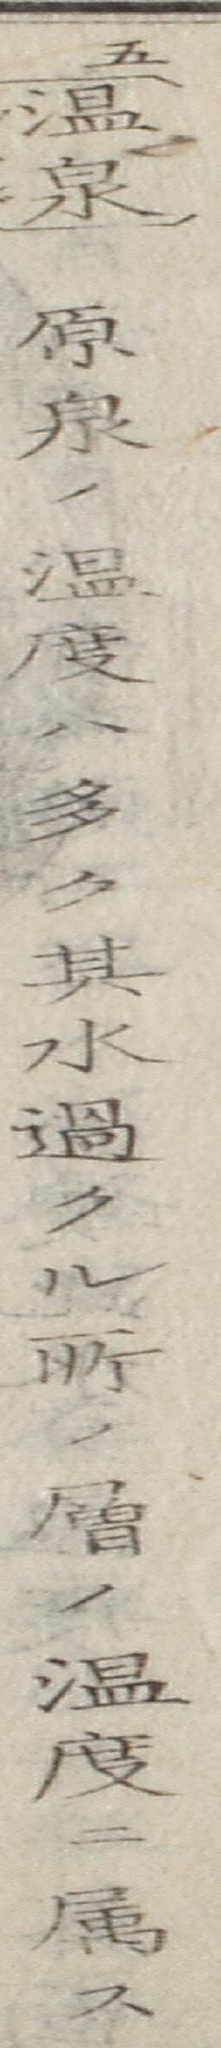五〔温泉〕原泉ノ温度ハ多ク其水過クル所ノ層ノ温度ニ属ス
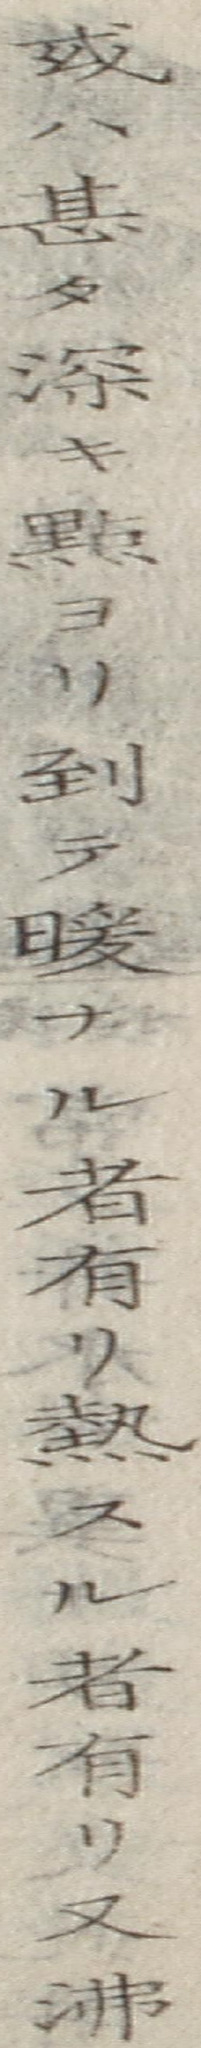或ハ甚タ深キ点ヨリ到テ暖ナル者有リ熱スル者有リ又沸
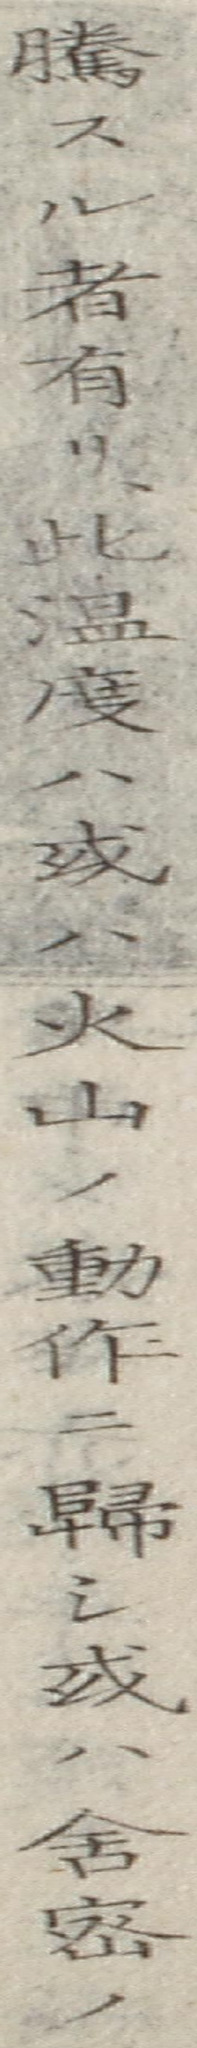騰スル者有リ、此温度ハ或ハ火山ノ動作ニ帰シ或ハ舎密ノ
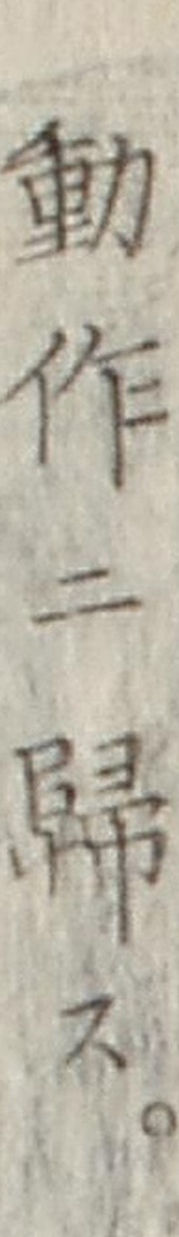動作ニ帰ス。
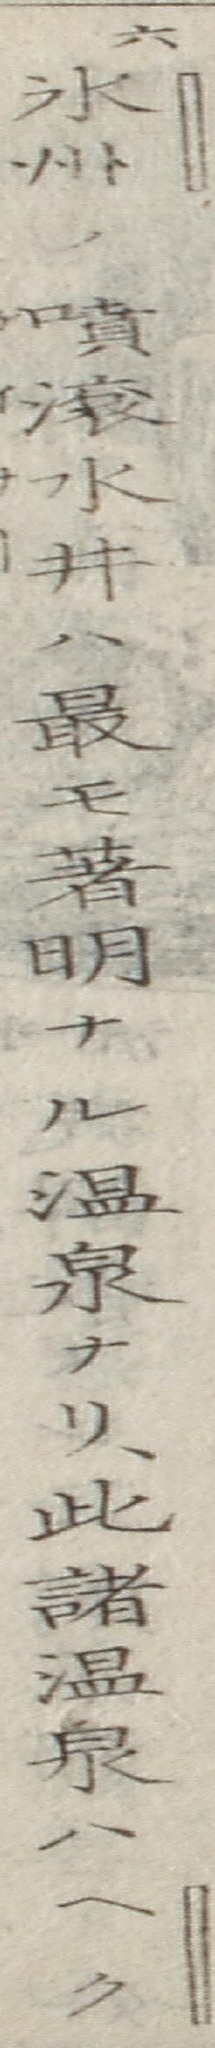六氷州ノ噴滾水井ハ最モ著明ナル温泉ナリ、此諸温泉ハヘク
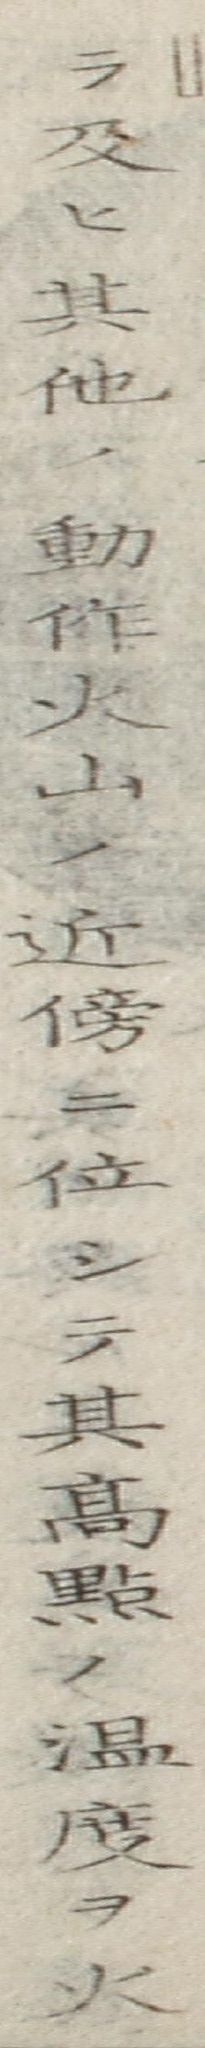ラ及ヒ其他ノ動作火山ノ近傍ニ位シテ其高点ノ温度ヲ火
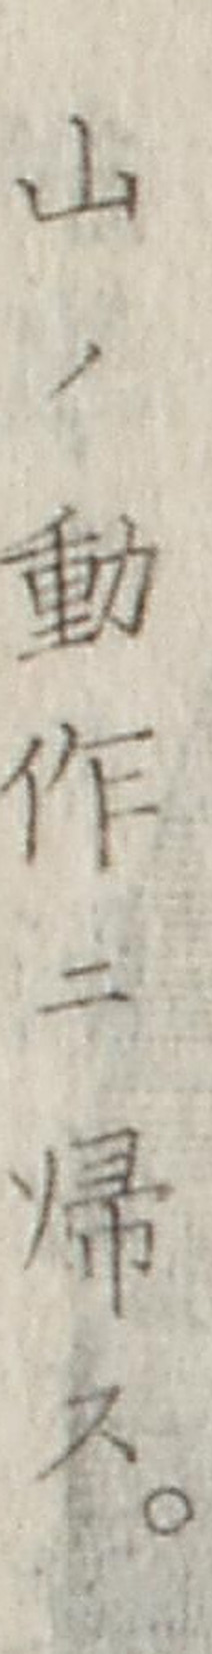山ノ動作ニ帰ス。
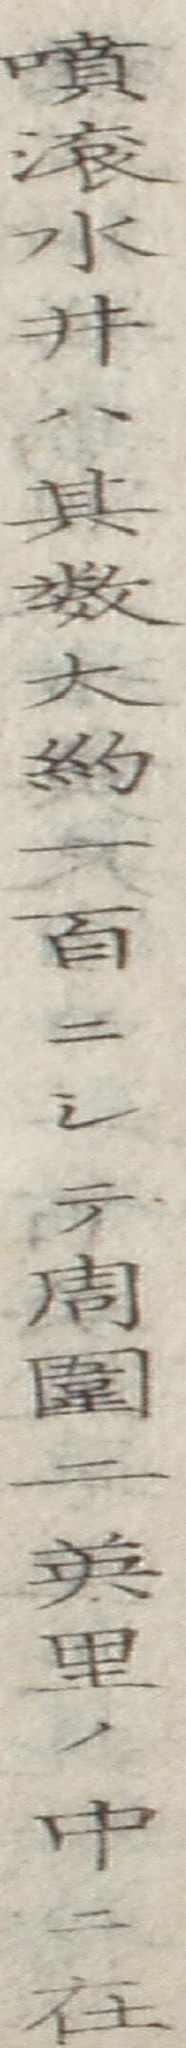噴滾水井ハ其数大約一百ニシテ周囲二英里ノ中ニ在
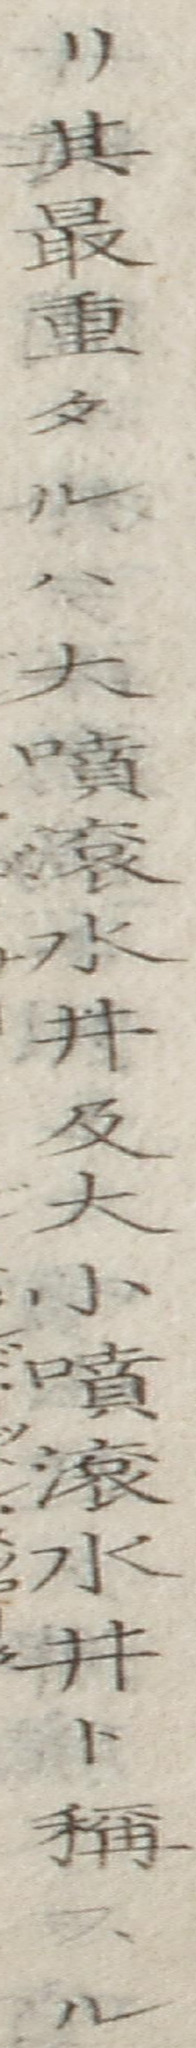リ其最重タルハ大噴滾水井及大小噴滾水井ト称スル
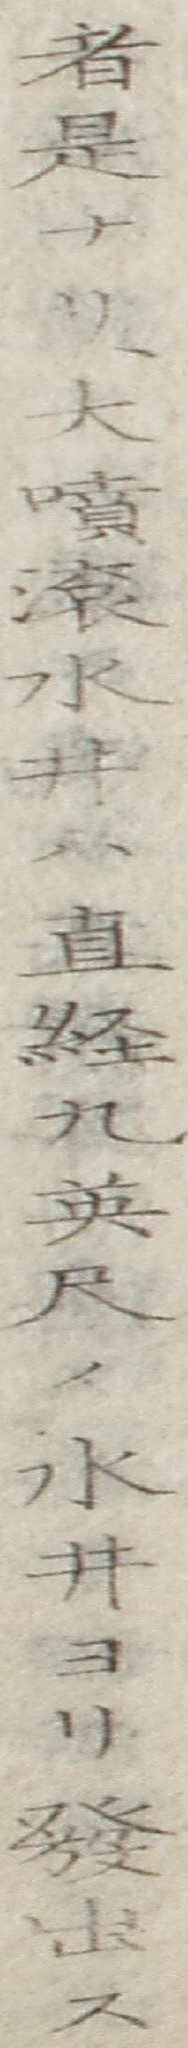者是ナリ、大噴滾水井ハ直径九英尺ノ水井ヨリ発出ス
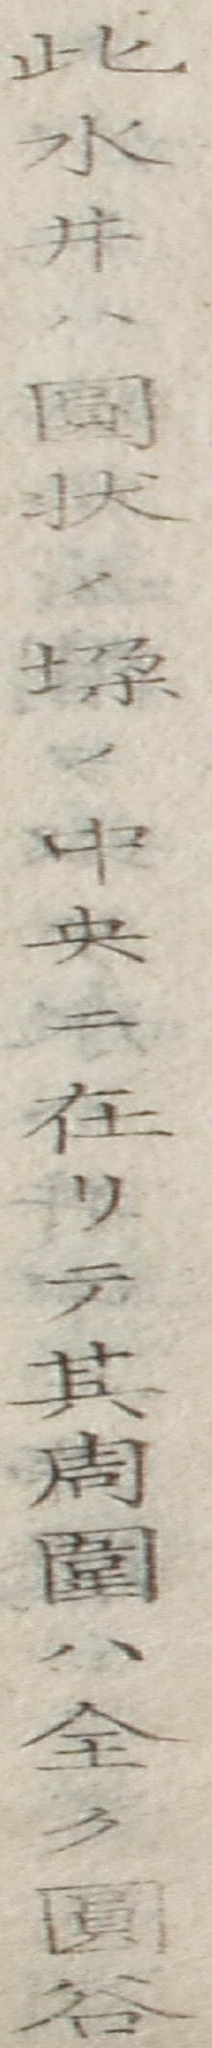此水井ハ円上ノ垜ノ中央ニ在リテ其周囲ハ全ク円谷

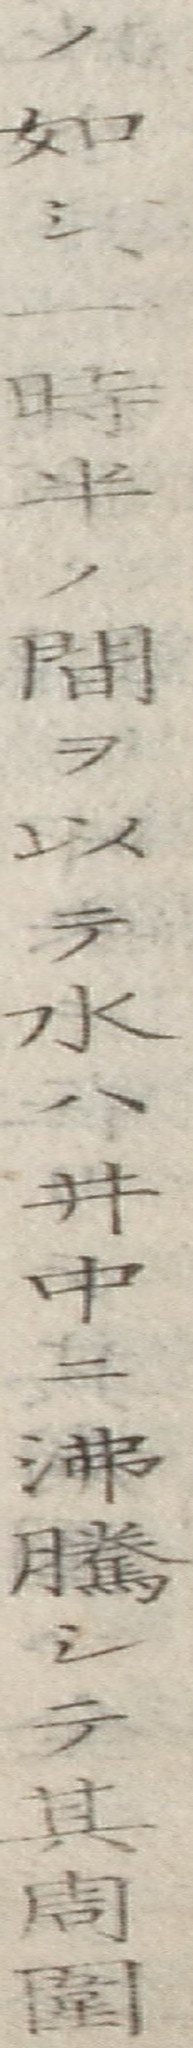ノ如シ、一時半ノ間ヲ以テ水ハ井中ニ沸騰シテ其周囲
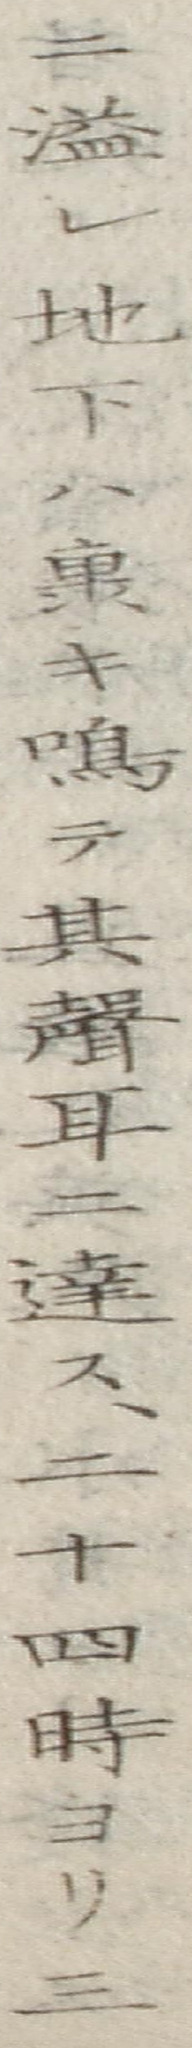ニ溢レ地下ハ轟キ鳴テ其声耳ニ達ス、二十四時ヨリ三
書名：地形論　巻二
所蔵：東京大学地震研究所図書室 Earthquake Research Institute Library, The University of Tokyo, JAPAN
